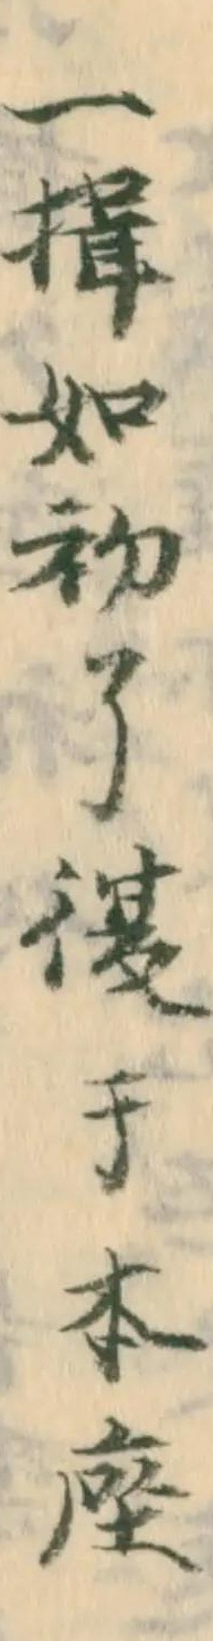一揖如初了復于本座
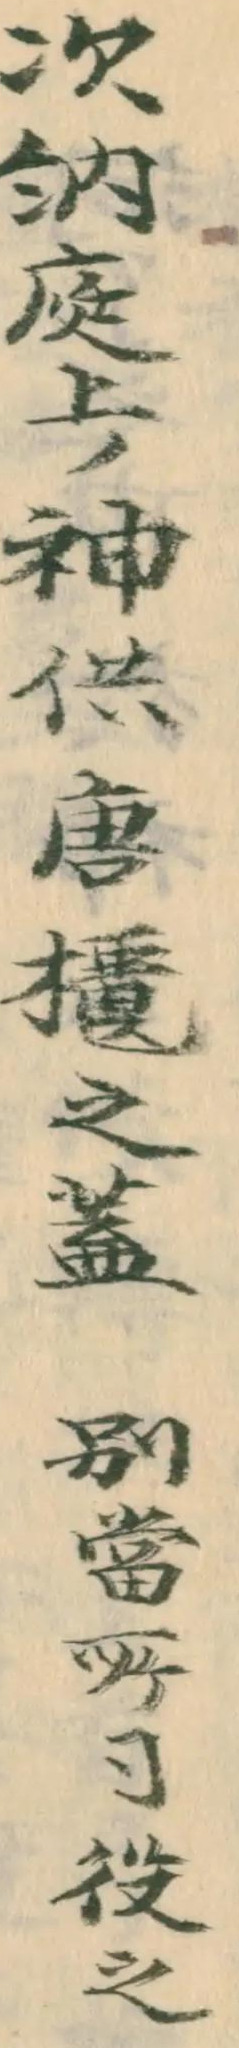次納庭上ノ神供唐櫃之蓋別当所司役之
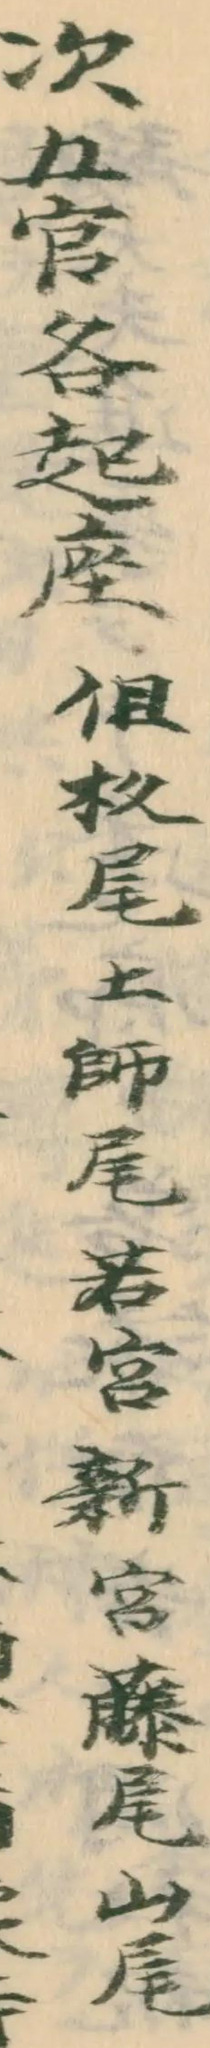次五官各起座但杉尾土師尾若宮新宮藤尾山尾
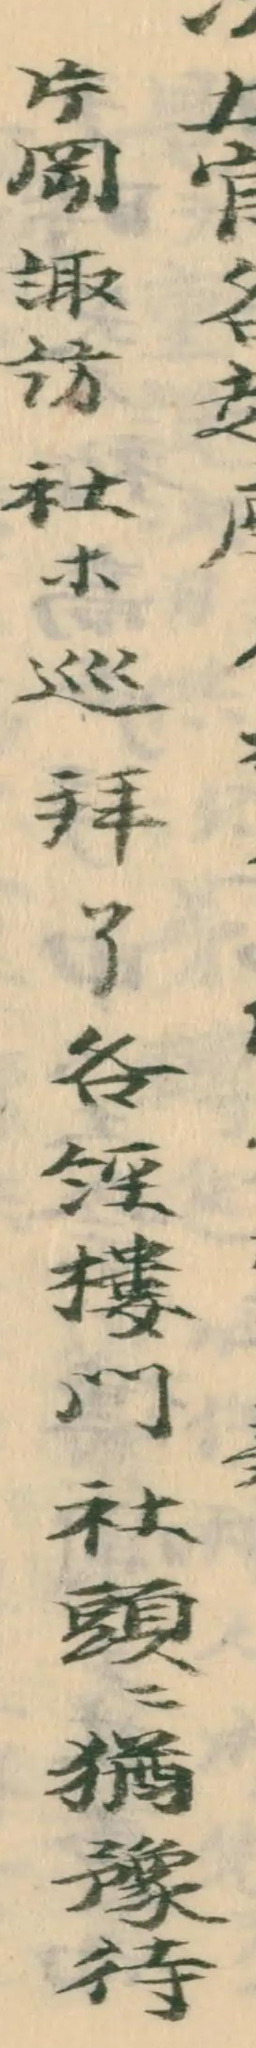片岡諏訪社等巡拝了各経楼門社頭ニ猶予待
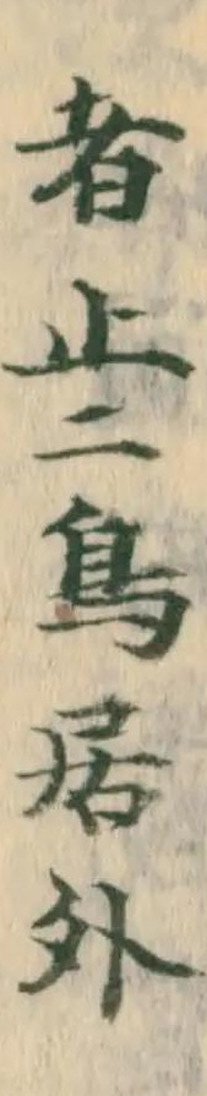者止二鳥居外
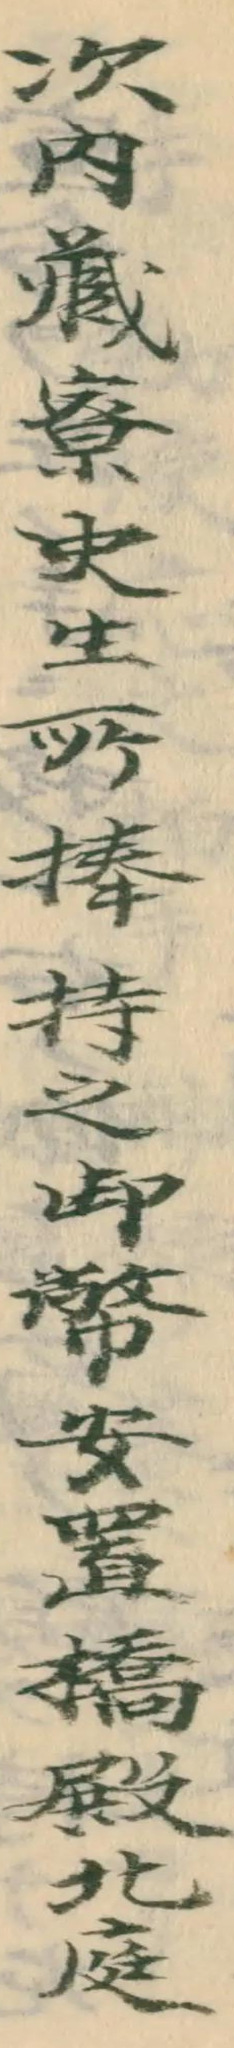次内蔵寮史生所捧持之御幣安置橋殿北庭
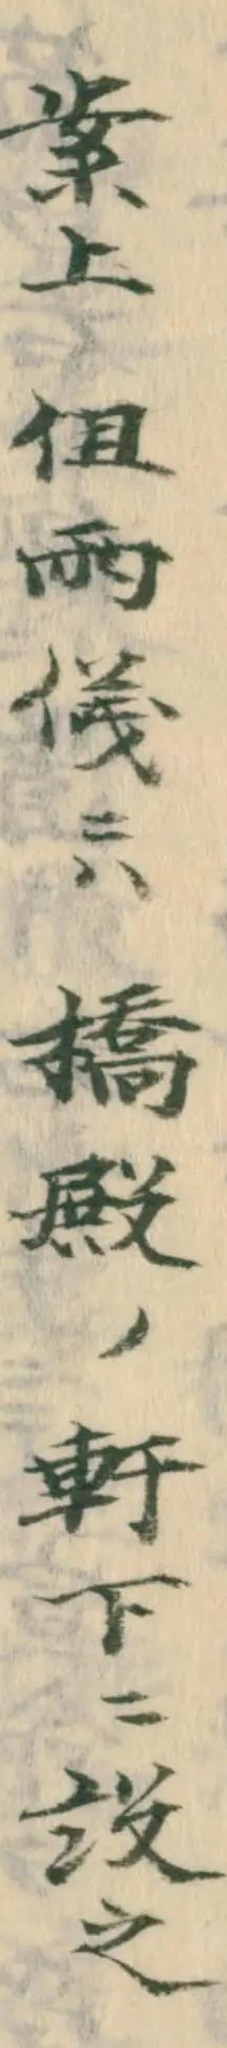案上但雨儀ニハ橋殿ノ軒下ニ設之
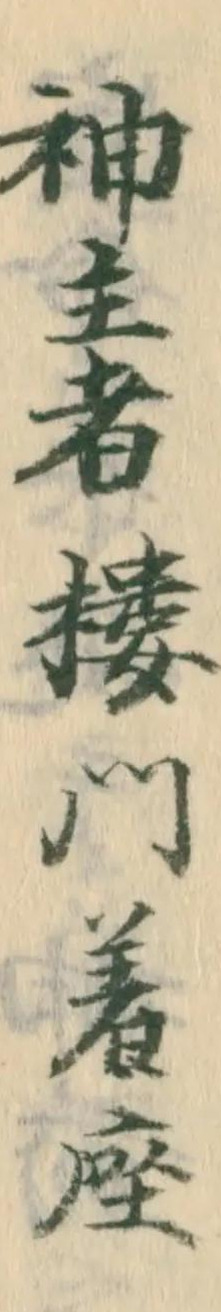神主者楼門着座
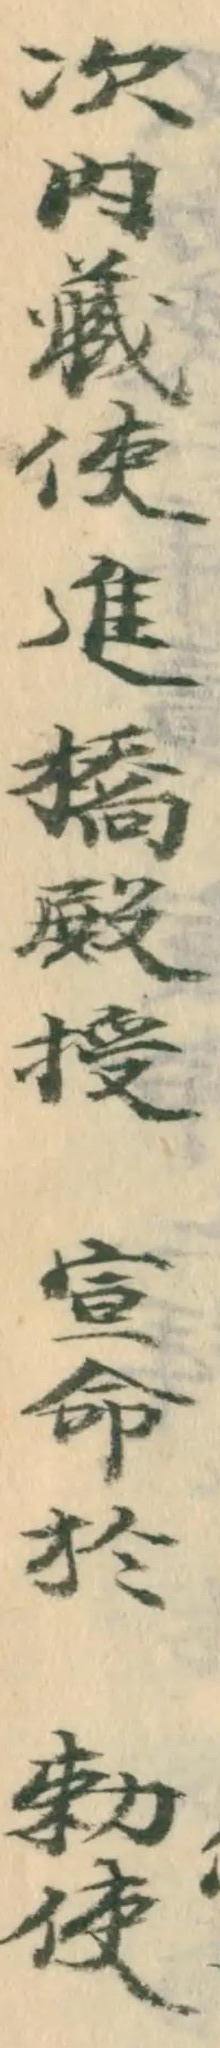次内蔵使進橋殿授宣命於勅使

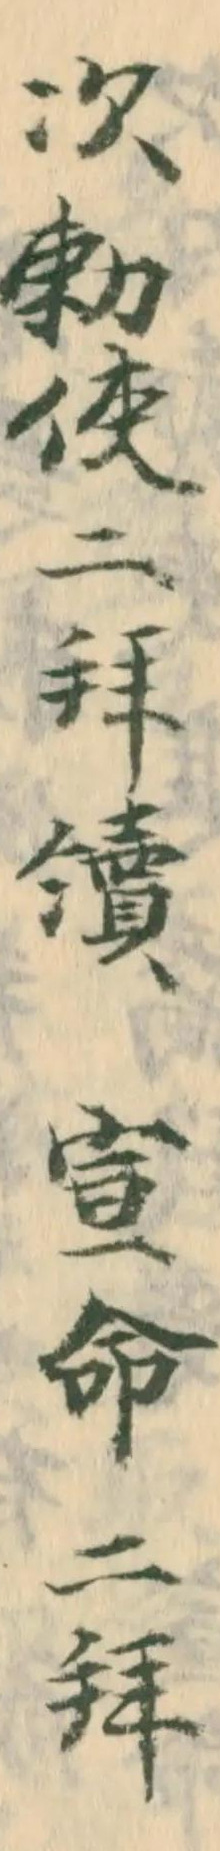次勅使二拝続宣命二拝
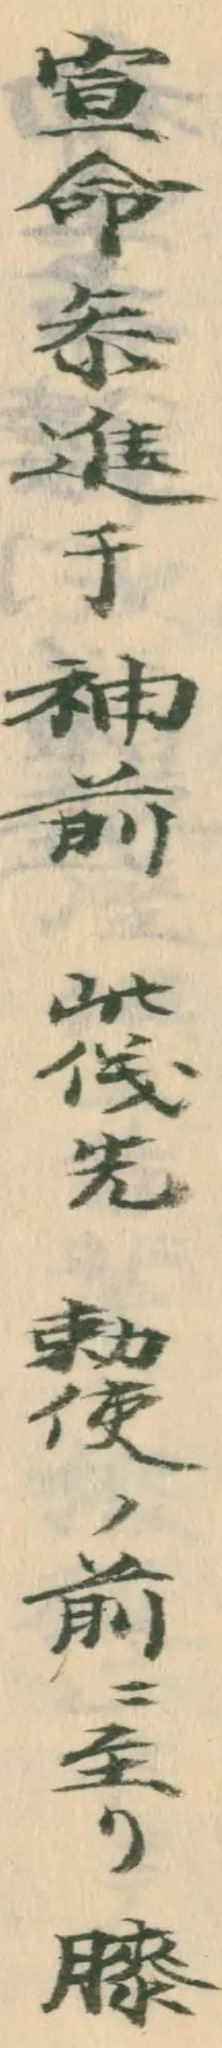宣命参進于神前此儀先勅使ノ前ニ至リ膝
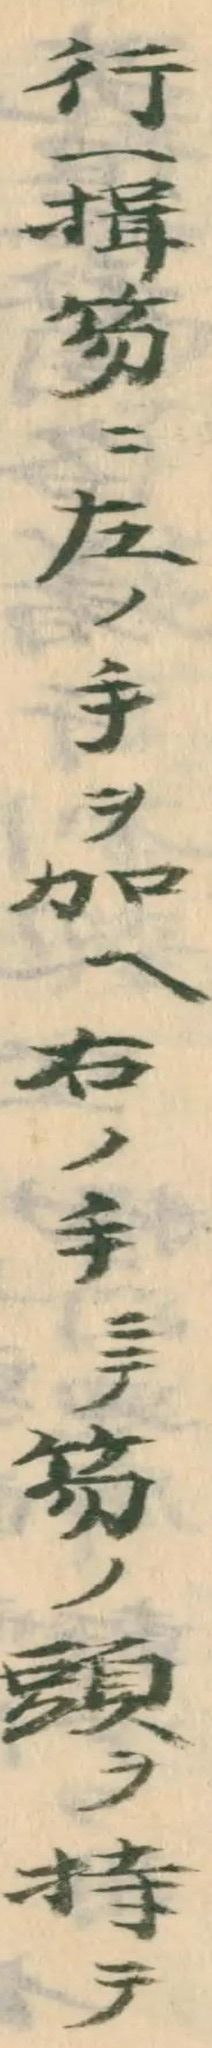行一揖笏ニ左ノ手ヲ加ヘ右ノ手ニテ笏ノ頭ヲ持テ
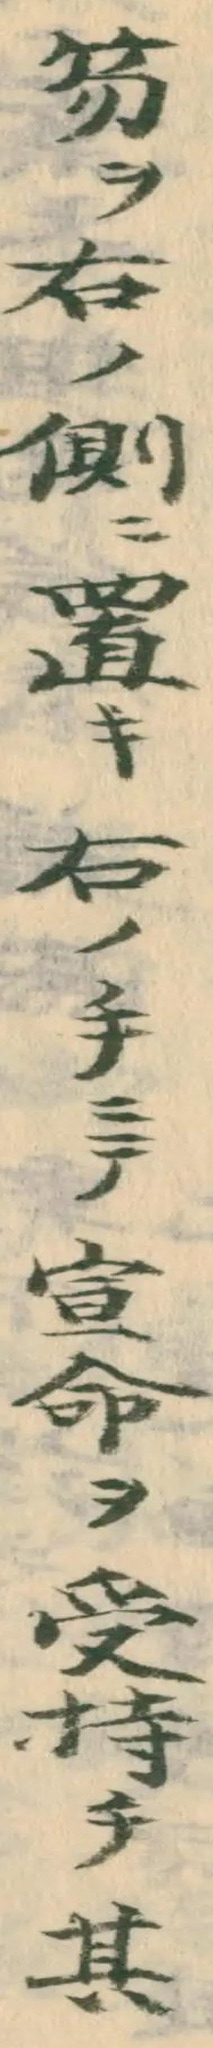笏ヲ右ノ側ニ置キ右ノ手ニテ宣命ヲ受持チ其
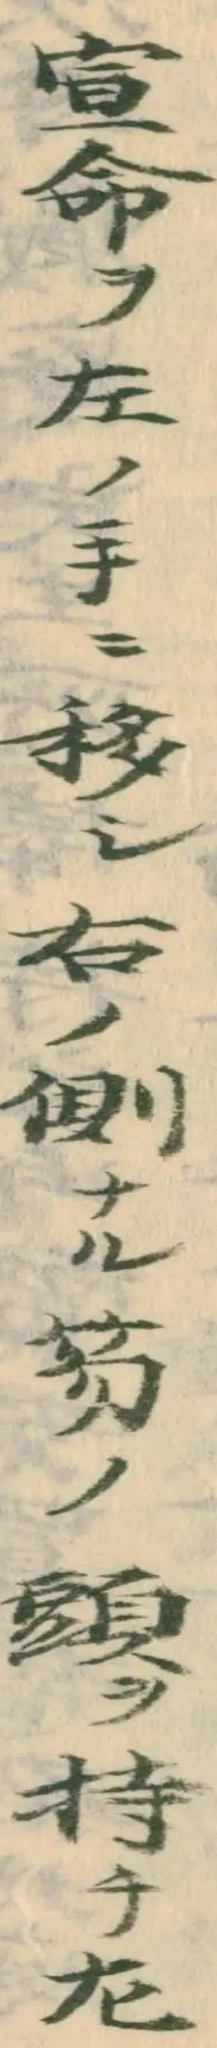宣命ヲ左ノ手ニ移シ右ノ側ナル笏ノ頭ヲ持チ左
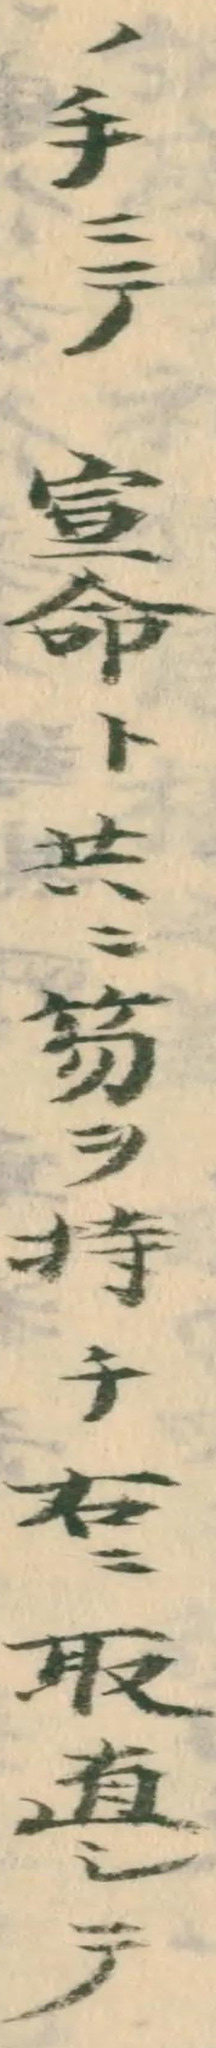ノ手ニテ宣命ト共ニ笏ヲ持チ右ニ取直シテ
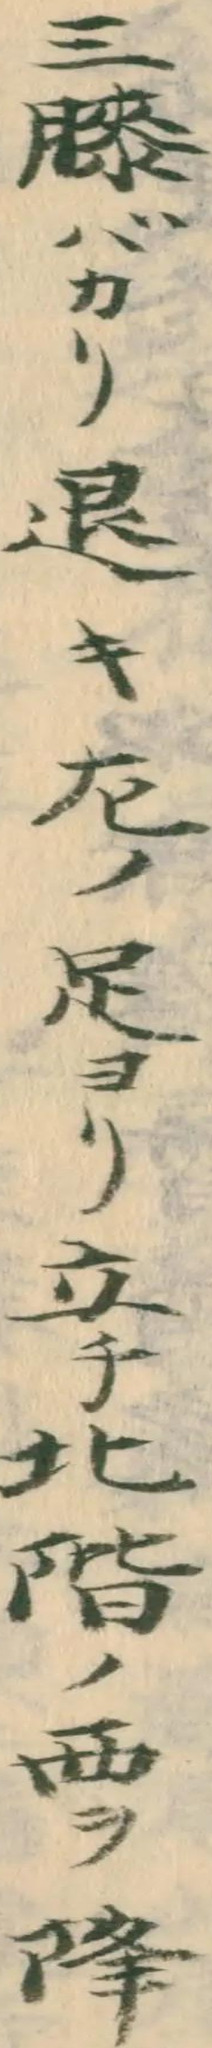三膝バカリ退キ左ノ足ヨリ立チ北階ノ西ヲ降
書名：賀茂社記録. 第5冊
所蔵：国立国会図書館 National Diet Library, JAPAN
